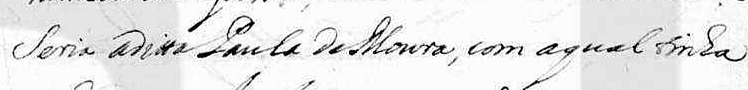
Seria a ditta Paula de Moura, com a qual tinha
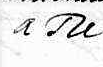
a Re
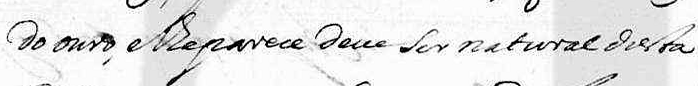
do ouro, e lhe parece deue ser natural desta
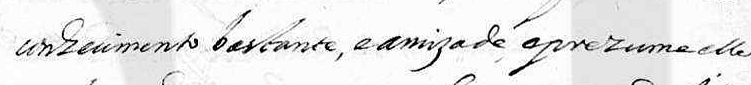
conhecimento bastante, e amizade e prezume elle
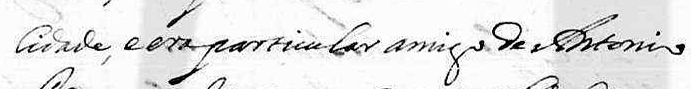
Cidade, e era particular amigo de Antonio
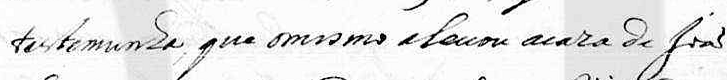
testemunha, que o mesmo a leuou a caza de Joaõ
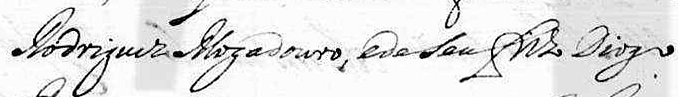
Rodriguez Mogadouro, e de seu filho Diogo
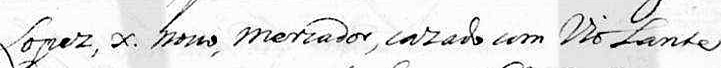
Lopez, x. nouo, mercador, cazado com Violante
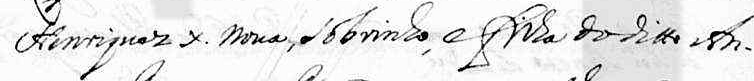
Henriquez x. noua, sobrinho, e filha do ditto An
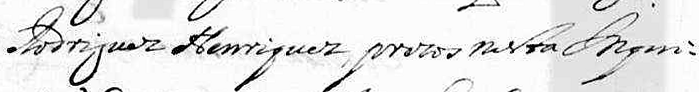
Rodriguez Henriquez prezos nesta Inqui
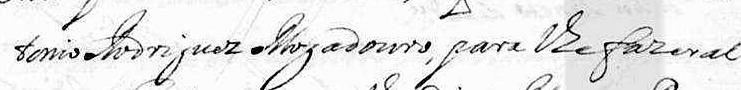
tonio Rodriguez Mogadouro, para lhe fazer al
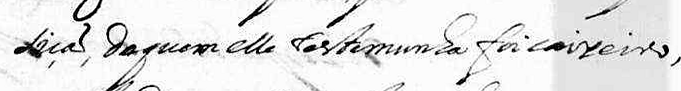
siçaõ, de quem elle testemunha foi caixeiro,
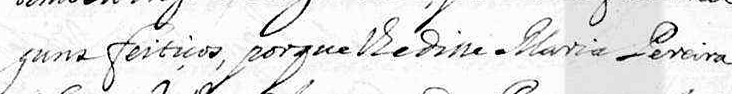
guns feitiços, porque lhe disse Maria Pereira
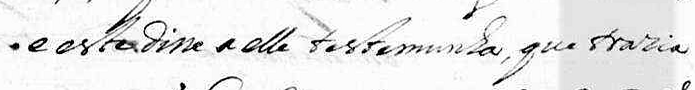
e este disse a elle testemunha, que trazia
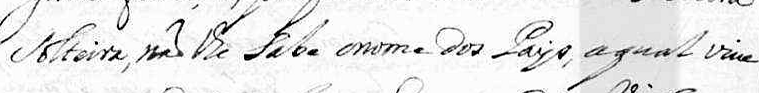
solteira, naõ lhe sabe o nome dos Pays, a qual viue
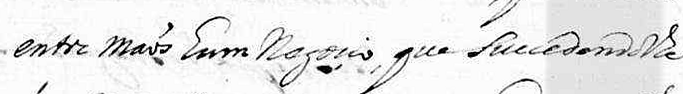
entre maõs hum Nogocio, que succedendolhe
